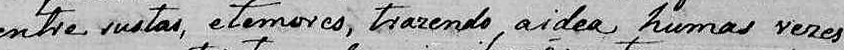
entre sustos, e temores, trazendo a idea humas vezes
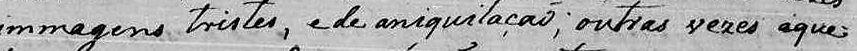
immagens tristes, e de aniquilaçaõ; outras vezes aque
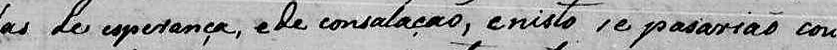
las de esperança, e de consolaçaõ, e nisto se pasariaõ cou
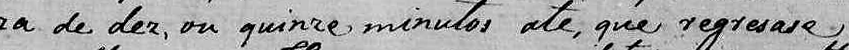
za de dez, ou quinze minutos ate, que regresase
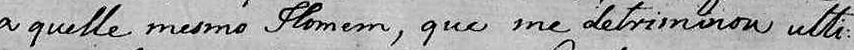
aquelle mesmo Homem, que me detriminou ulti
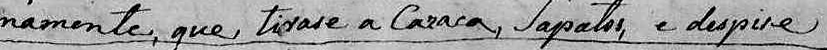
mamente, que, tirase a cazaca, sapatos, e despise
